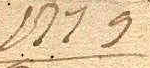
1779
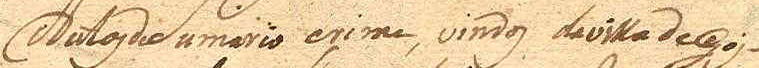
Autos de Sumario crime, vindos da Villa de Goj
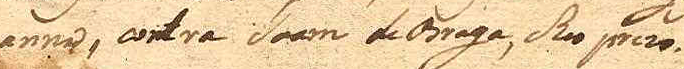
anna, contra Ioam de Braga, Reo prezo.
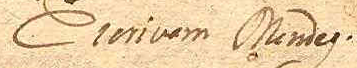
Escrivam Mendes.
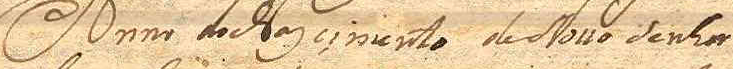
Anno do Nasçimento de Nosso senhor
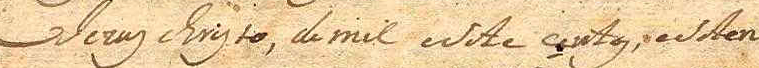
Iezus christo, de mil e setecentos e seten
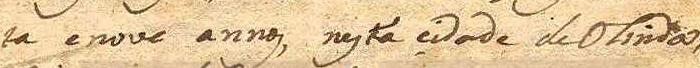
ta e nove annos nesta cidade de Olinda,
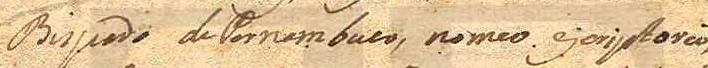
Bispado de Pernambuco, no meo escriptorio
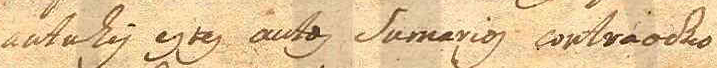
autuhej estes autos Sumarios contra o Reo
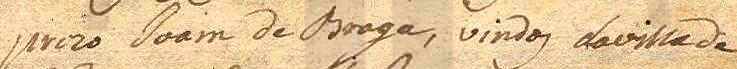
prezo Ioam de Braga, vindos da villa de
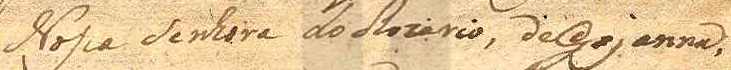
Nossa senhora do Rozario, de Gojanna,
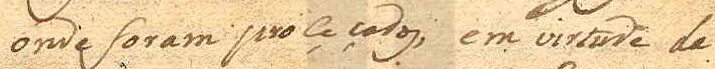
onde foram proçeçados, em virtude da
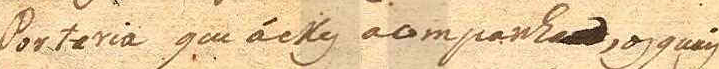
Portaria que á elles acompanha_, os quais
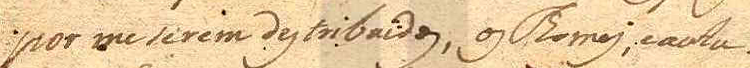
por me serem destribuidos, os thomej, e auttu
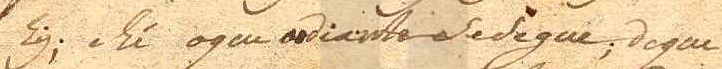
hej; e hé o que aodiante se segue; de que
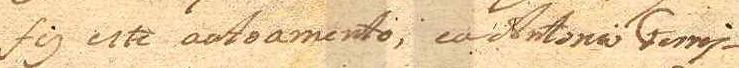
fis este autoamento, eu Antonio Ferrej
